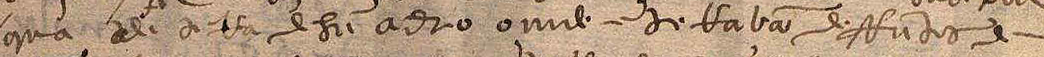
qua _de teRa de hū adro omde ēteRavão deffūtos de
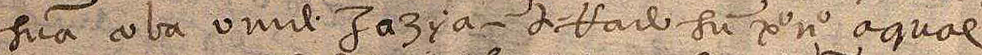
huā cova omde Jazya ēteRado hū xo no a qual
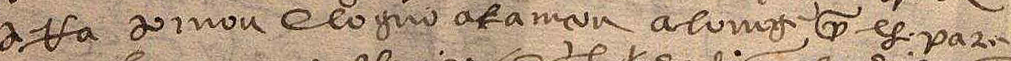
teRa tomou eloguo a lamçou a lomgē p̄o lhe pare
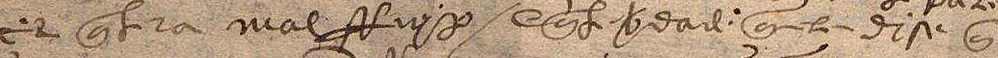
çer q̄ hera mal ffeyto / e q̄ he ꝟdade q̄ ele dise q̄
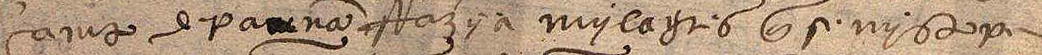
samto de pao não ffazya mylagres q̄ se nysto pe
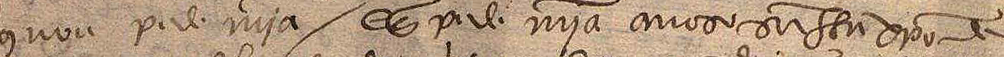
quou pede m̄ja / e q̄ pede m̄ja a noso sōr Jhū xpō de
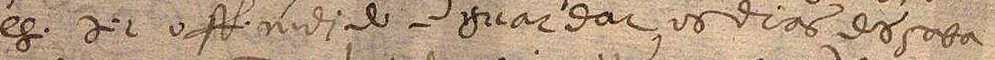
lhe ter offemdjdo ē guardar os dias dos saba
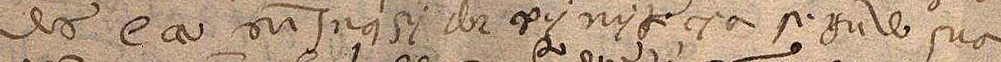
dos e ao sōr Jnqisydor pynytēcya segūdo sua
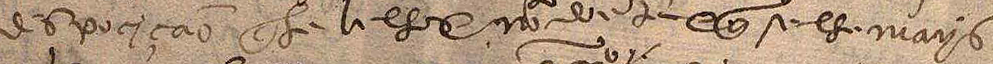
despocyção q̄ he velho e mto doēte e q̄ se lhe mays
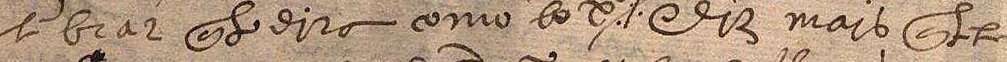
lēbrar q̄ ho djra como b̄o xo ./. e djz majs q̄ ele
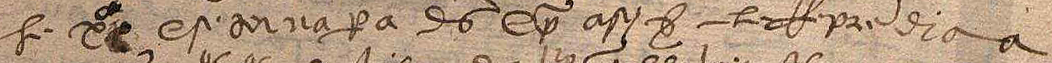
he xop e se torna ꝑa ds̄ e p̄o asy ꞩ ele Reprēdia a
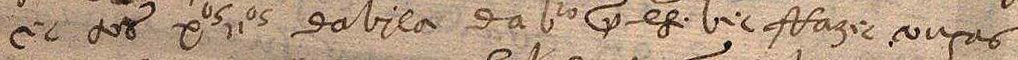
çertos xos nos da vjla davro p̄o lhe ver ffazer cousas
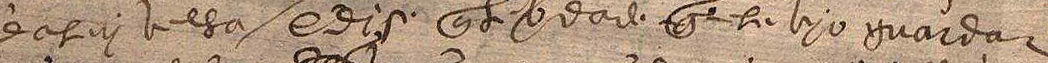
da Ley velha / e dise q̄ he ꝟdade q̄ ele vyo guardar
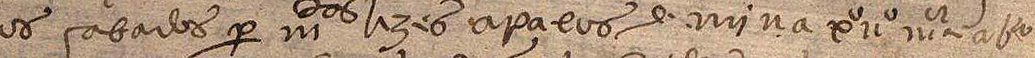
os sabados ꝑ mtas vezes a palos de mjna xo no mor ē avro
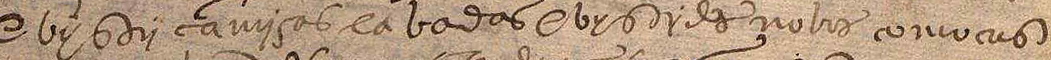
e vysty camjsas lavadas e vystydos novos como cus
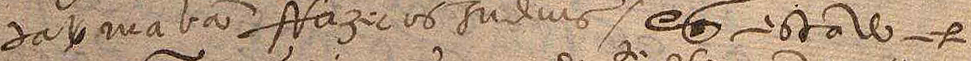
tavmavão ffazer os Judeus / e q̄ estādo ele
